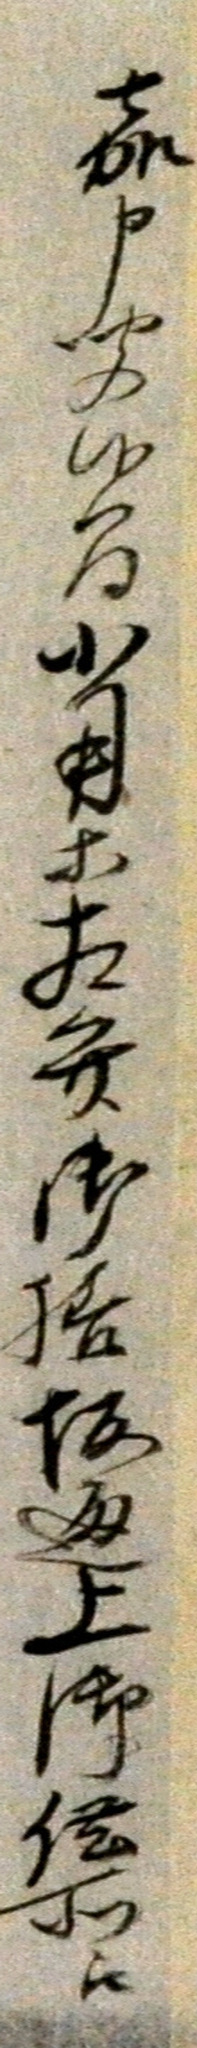嘉申聞候間小用等相弁御膳坂通上御供所え
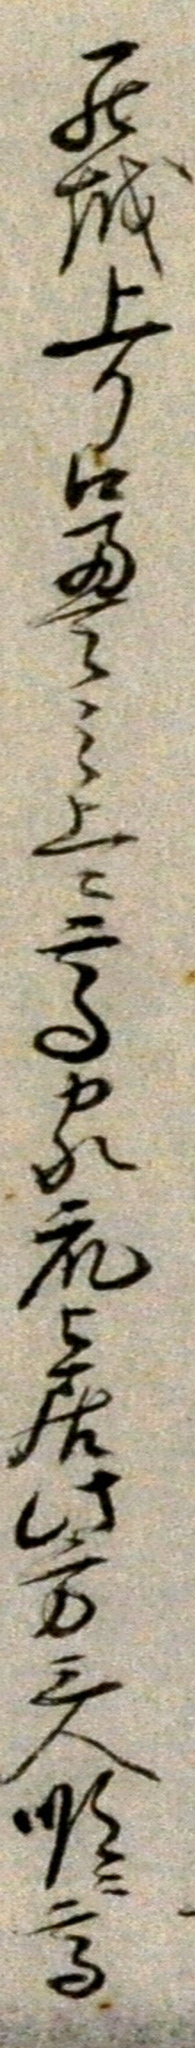罷越上り口畳之上ニ高家衆被居此方三人順ニ高
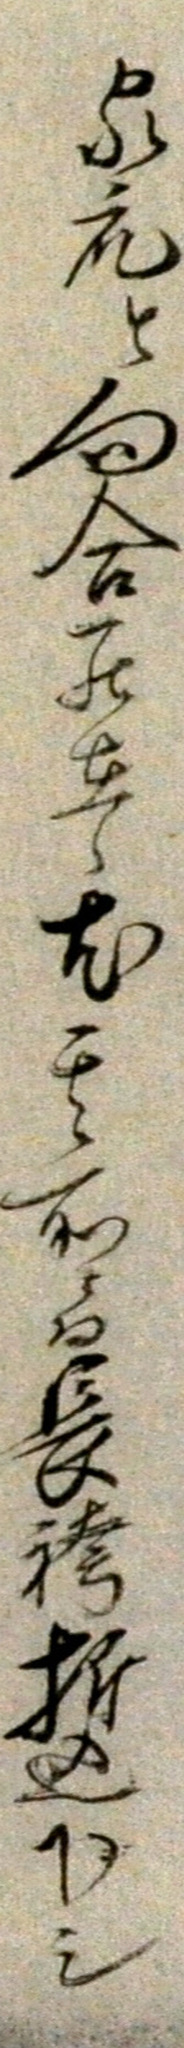家衆と向合罷在候尤其所ニ而長袴折込下シ
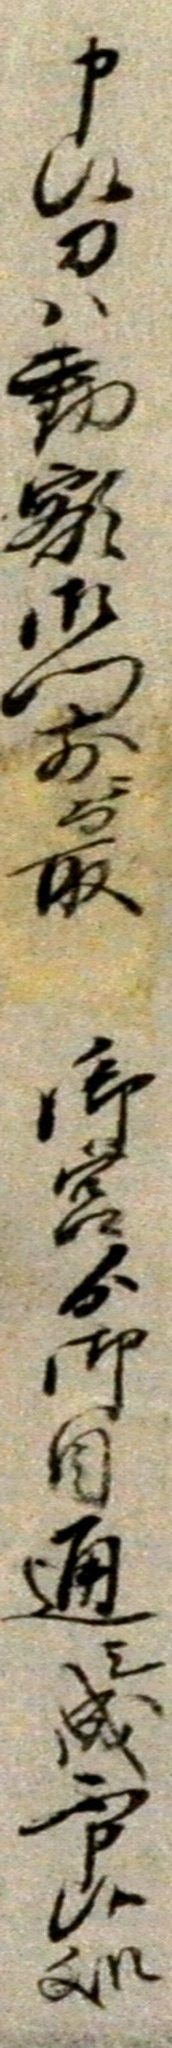申候刀ハ勅願御門前ニ而取御宮ゟ御目通シ成不申候処
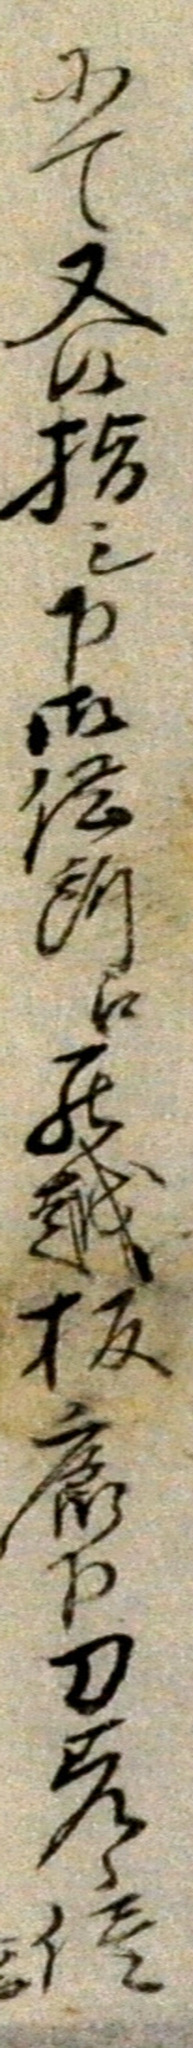にて又候指シ下御供所え罷越板廊下刀差候侭ニ而
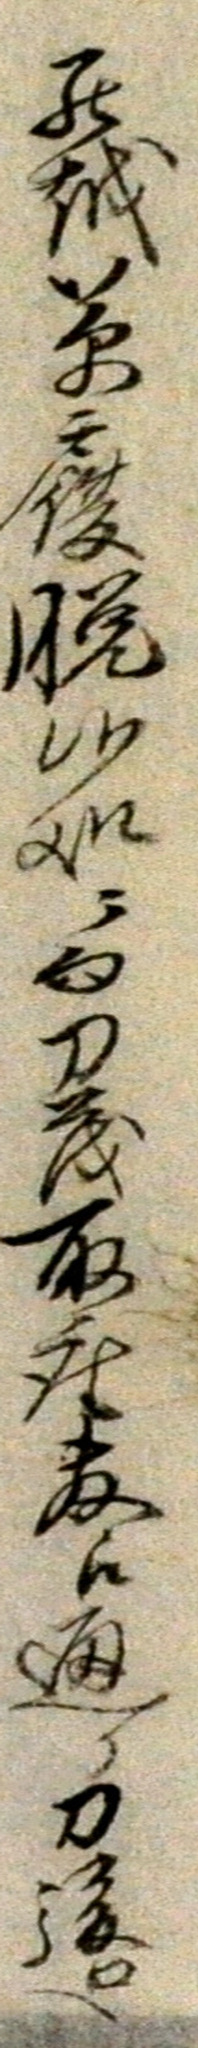罷越草履脱候処ニ而刀も取座敷え通り刀後ロへ
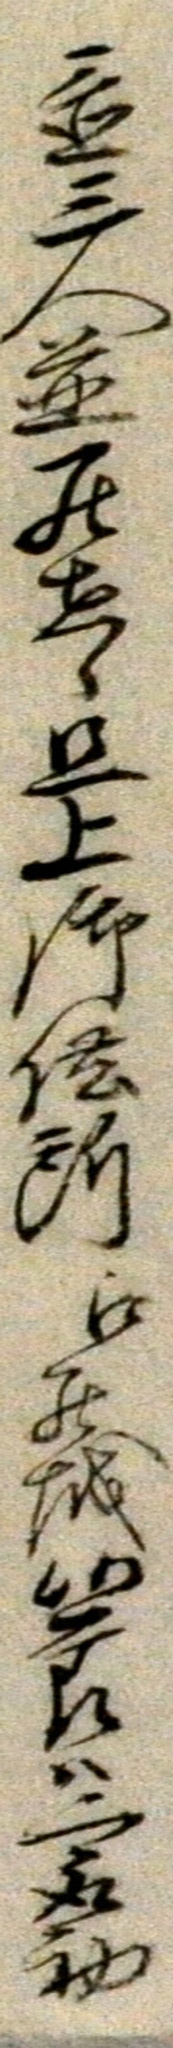置三人並罷在候且上御供所え罷越候節ハ最初
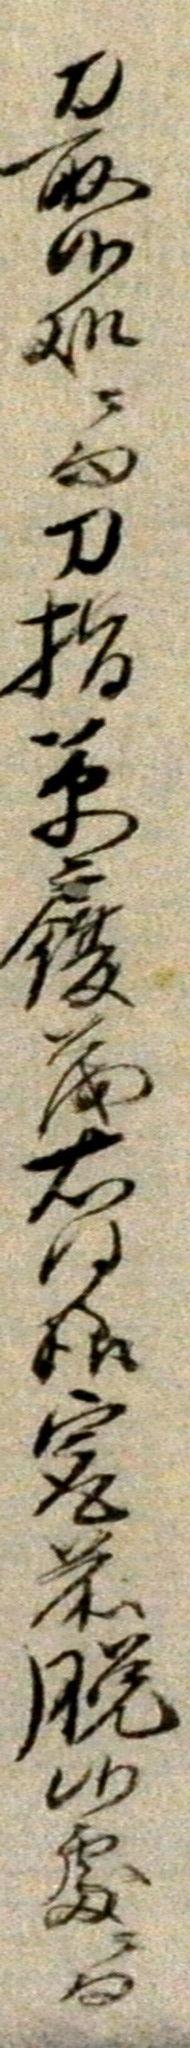刀取候処ニ而刀指草履も右同様最前脱候処ニ而
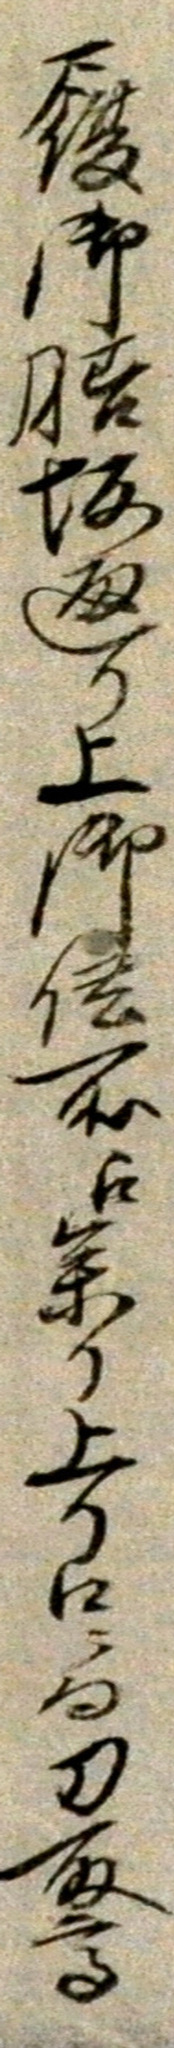履御膳坂通り上御供所え参り上り口ニ而刀取高
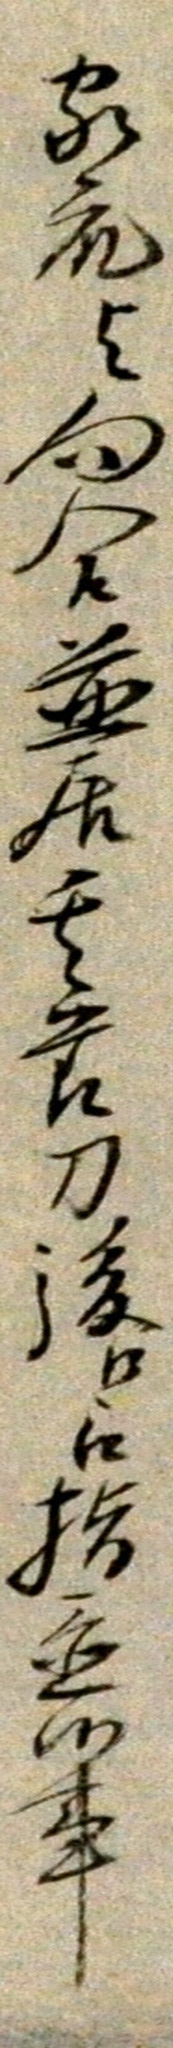家衆と向合並居其節刀後ロえ差置候事
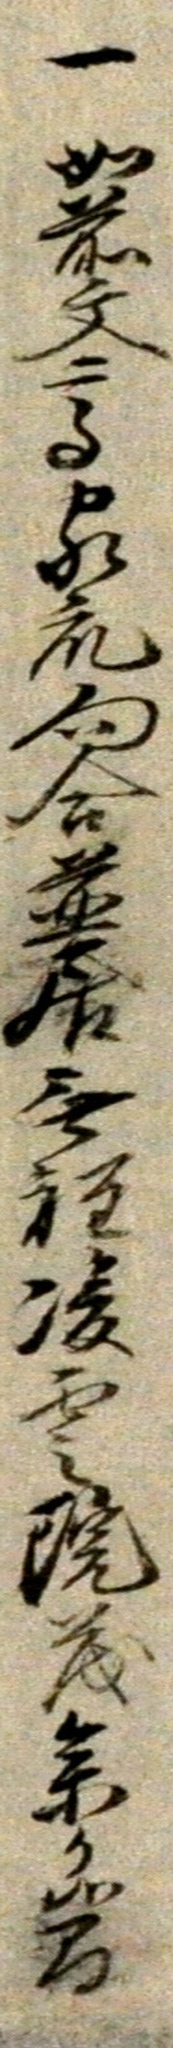一如前文高家衆向合並居無程凌雲院も参り候間
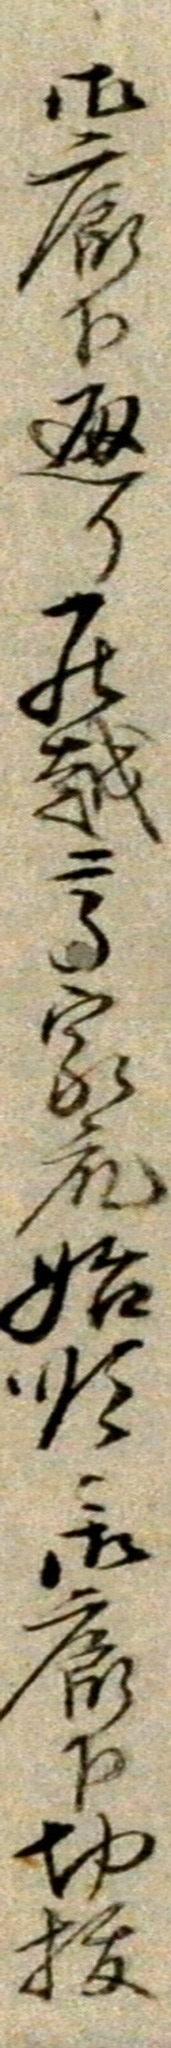御廊下通り罷越高家衆始順ニ御廊下切抜
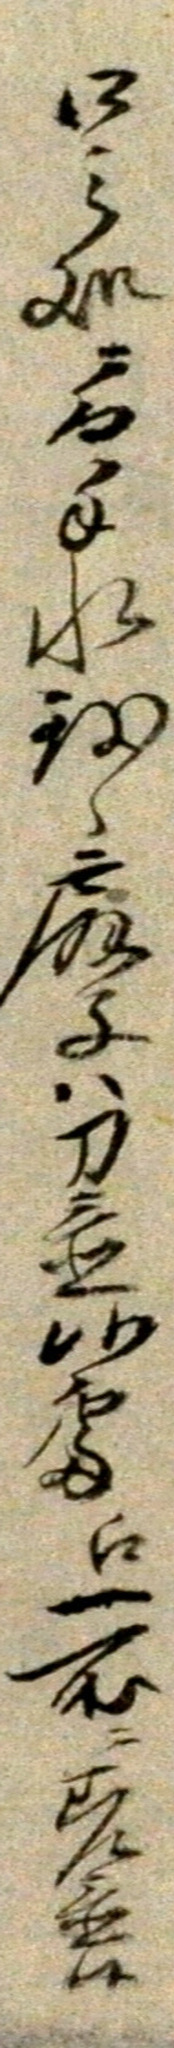口之処ニ而手水致候扇子ハ刀置候処え一所ニ差置候
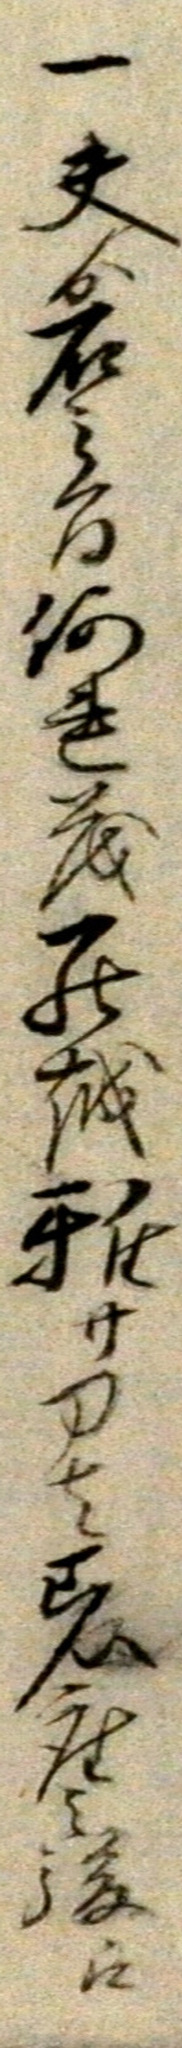一夫ゟ石之間何れも罷越稚サ刀は着座之後え
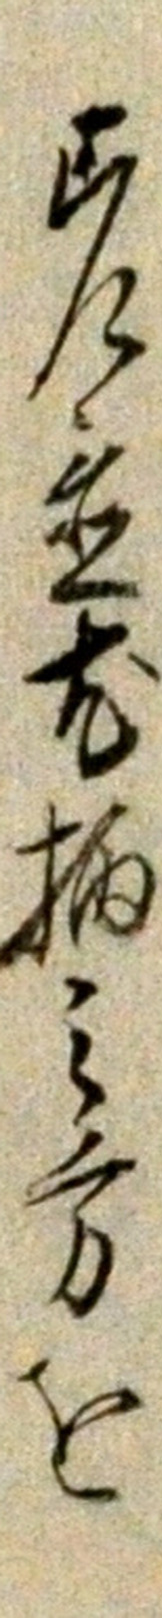差置尤柄之方を
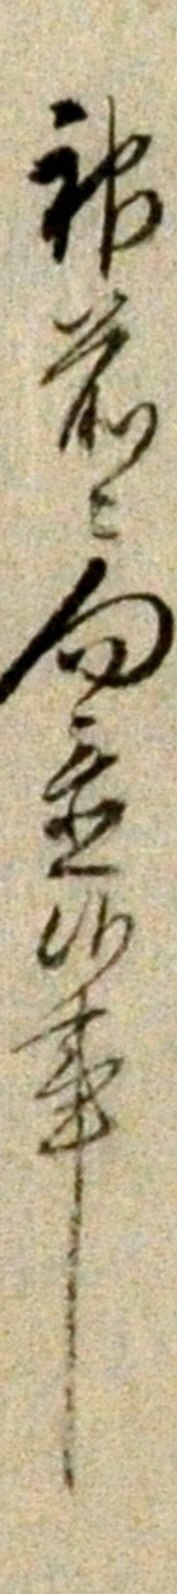神前ニ向置候事
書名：御鏡餅御用留（写）
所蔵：伊那市立高遠町図書館・合同会社AMANE
